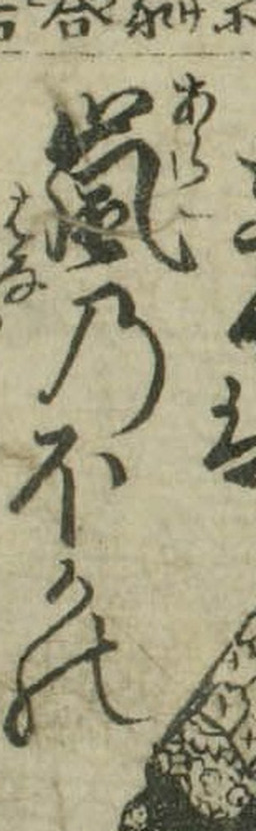嵐のほかの
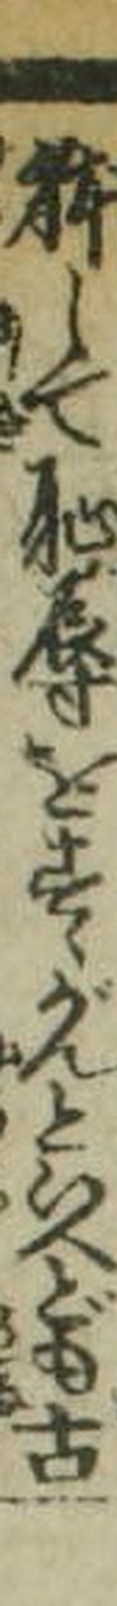躰して恥辱をすゝがんといへども古
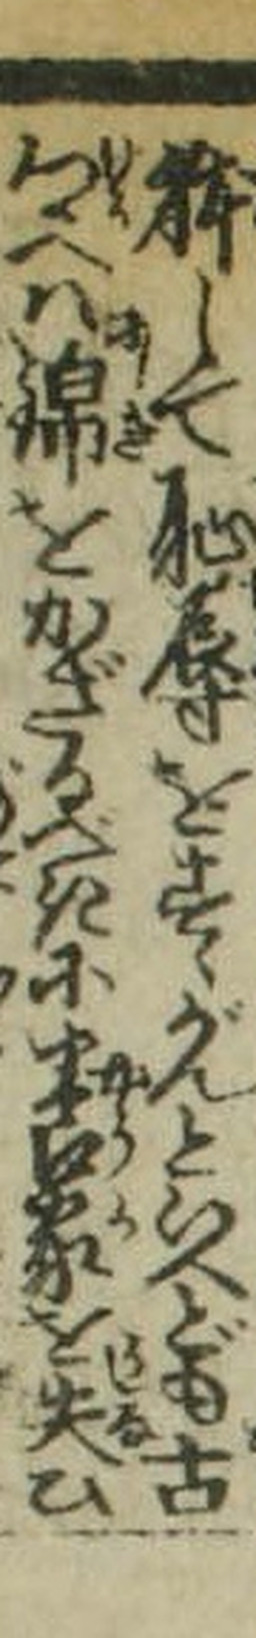卿は錦をかざるべきに養家を失ひ
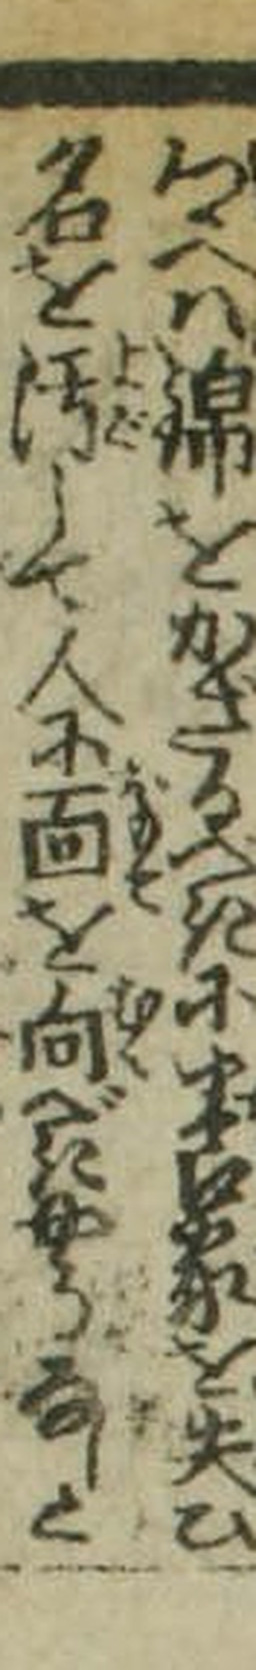名を汚して人に面を向べきやうなしと
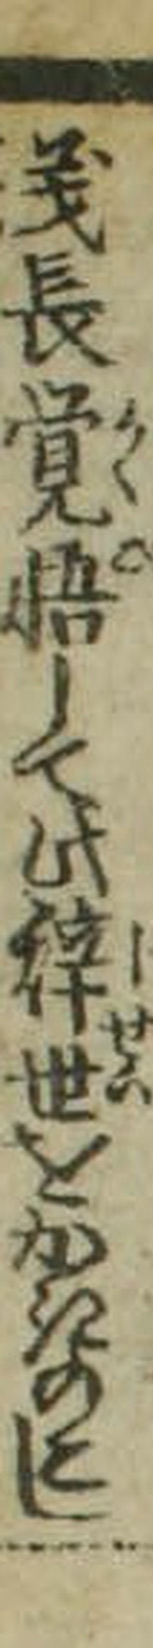義長覚悟して此辞世をかきのこし
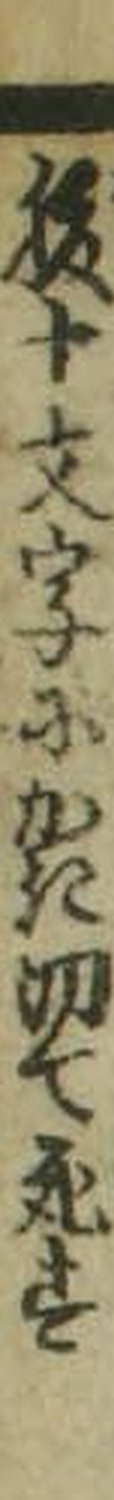腹十文字にかき切て死す

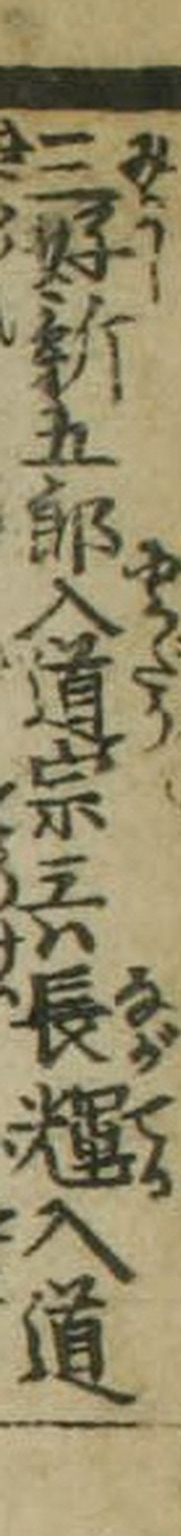三好新五郎入道宗三は長輝入道
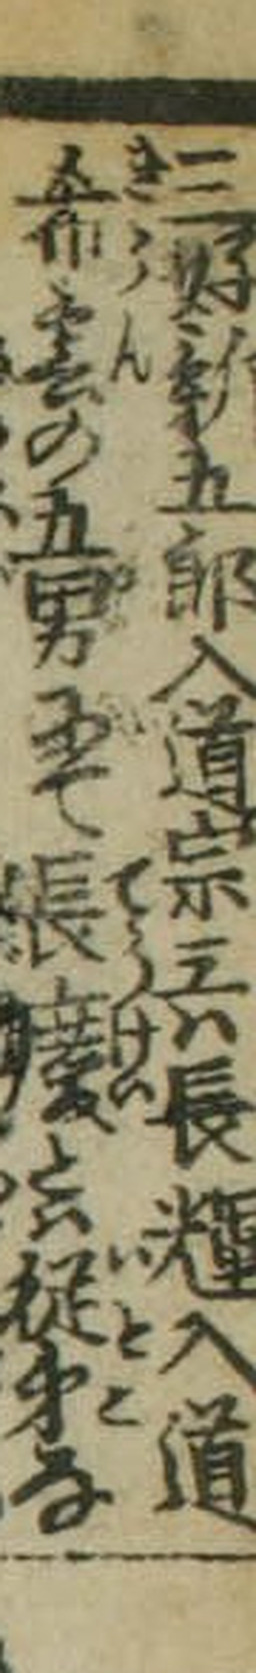希雲の五男にて長慶とは従弟な
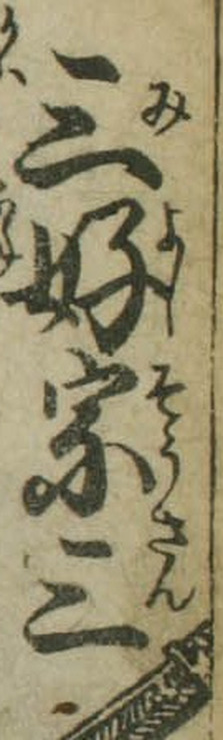三好宗三
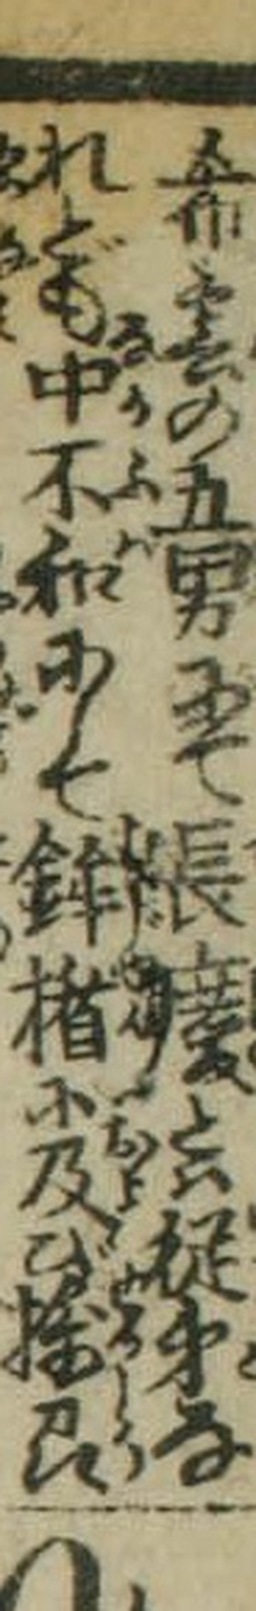れども中不和にして鉾楯に及び摂州
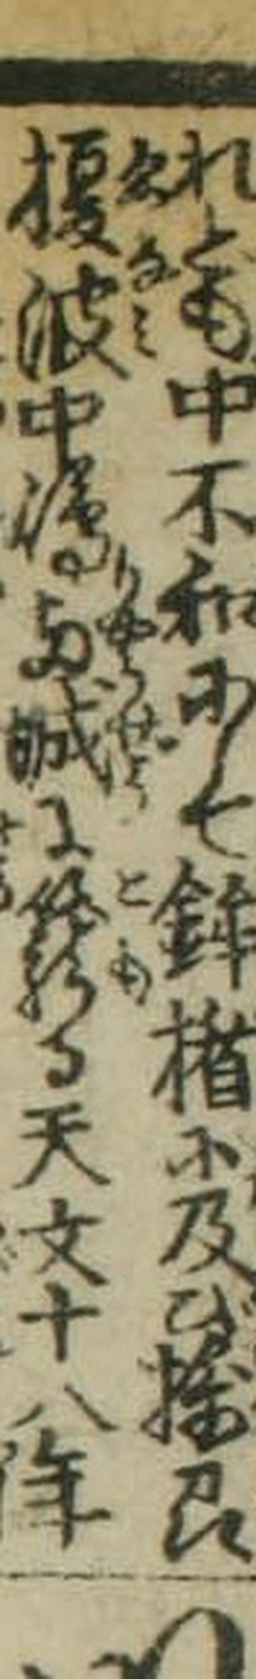榎波中嶋両城に籠る天文十八年
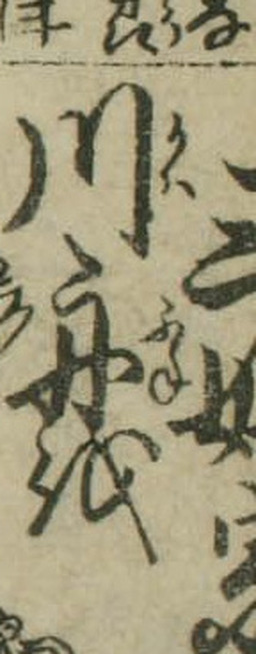川舟を
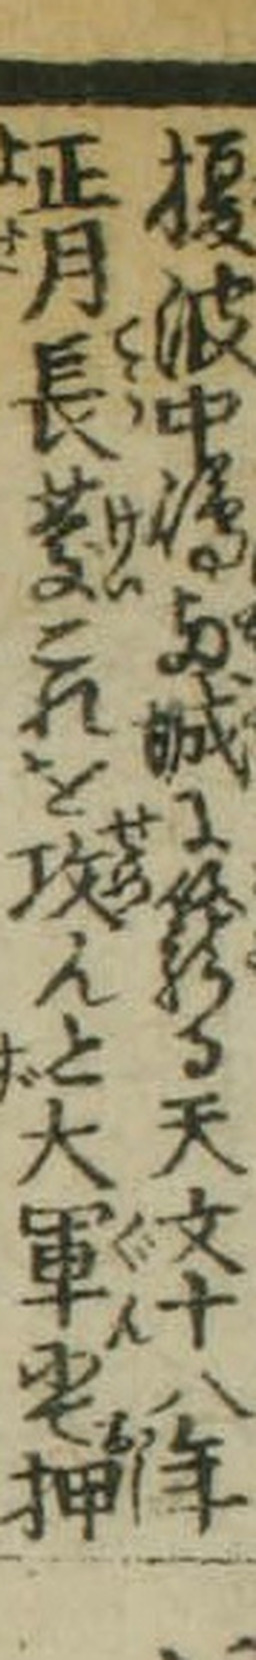正月長慶これを攻んと大軍にて押
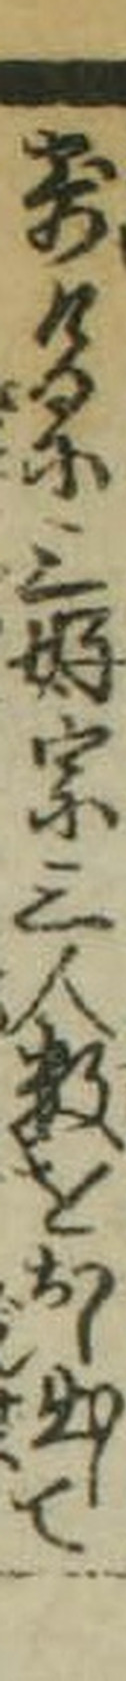寄けるに三好宗三人数をおし出して
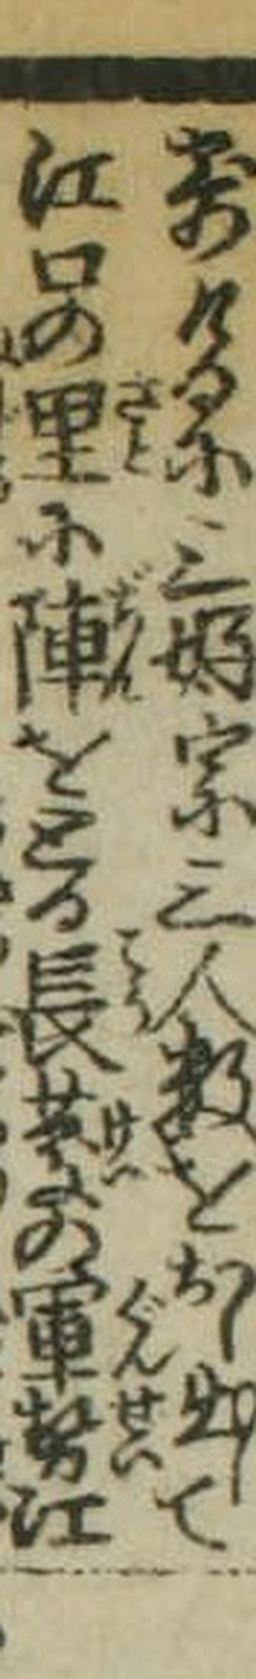江口の里に陣をとる長慶の軍勢江
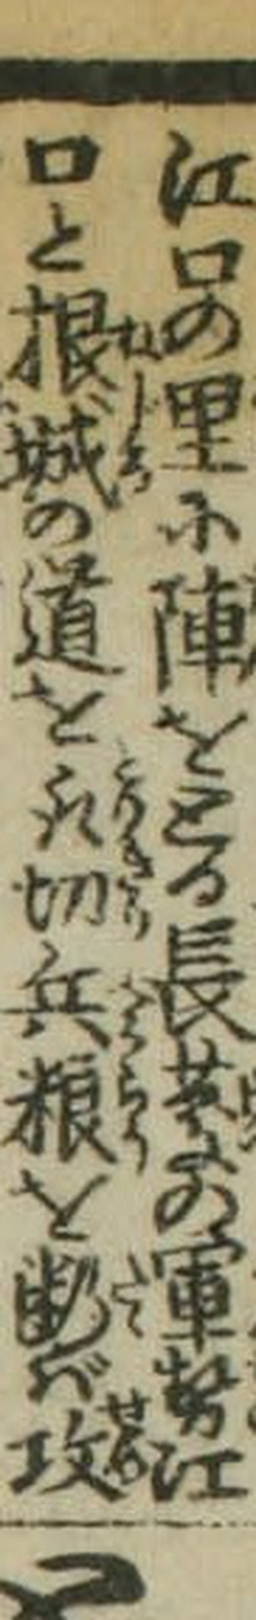口と根城の道を取切兵粮を断ば攻
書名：續英雄百人一首
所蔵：東京学芸大学附属図書館
